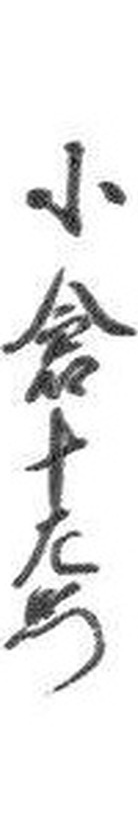小倉十左衛門
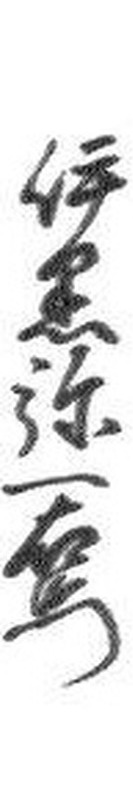伊黒弥一右衛門
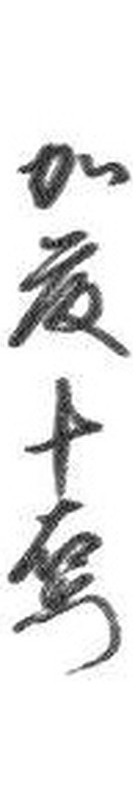加藤十右衛門
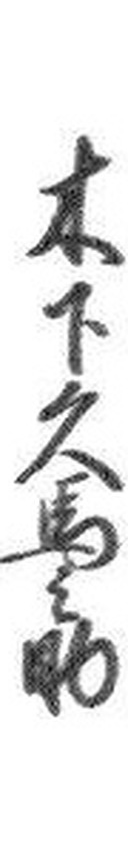木下久馬之助
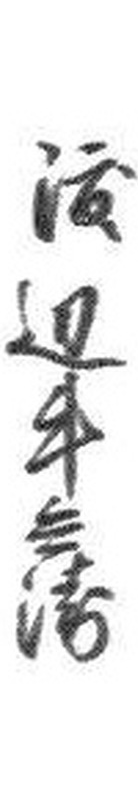渡辺牛兵衛
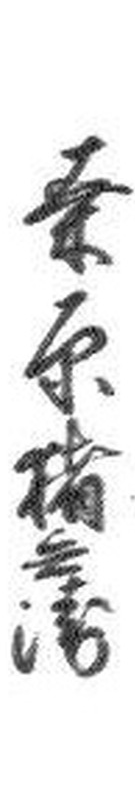桑原猪兵衛
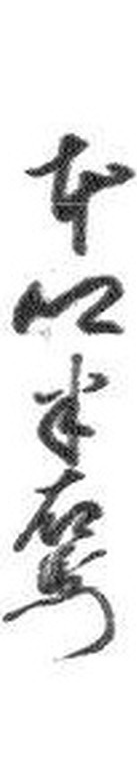本郷半右衛門
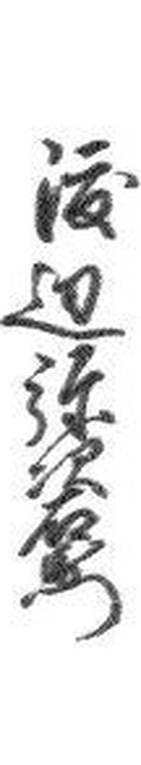渡辺弥次右衛門
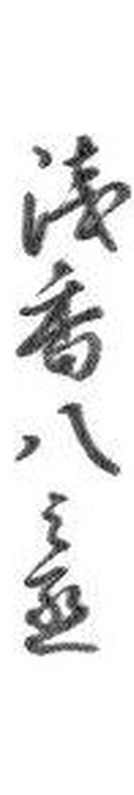浅香八之丞

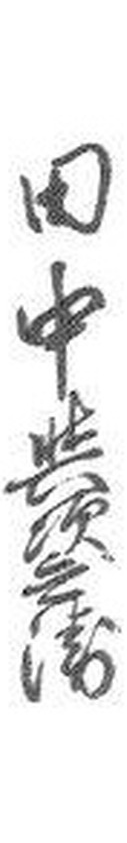田中与次兵衛
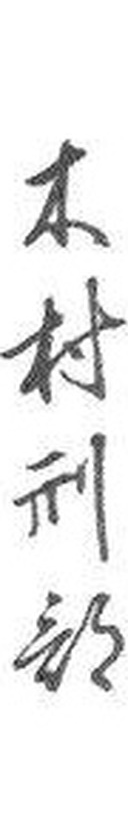木村刑部
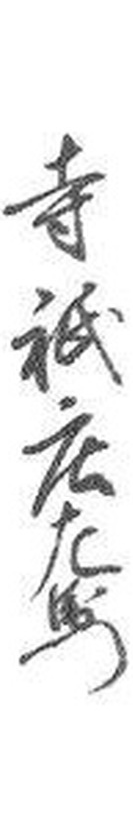寺祇庄左衛門
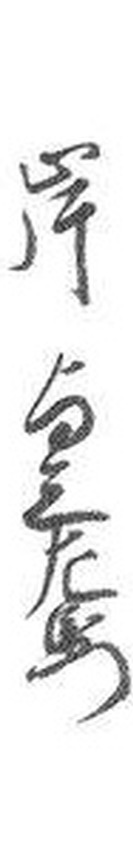岸与三左衛門
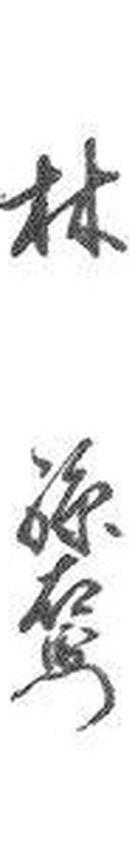林孫右衛門
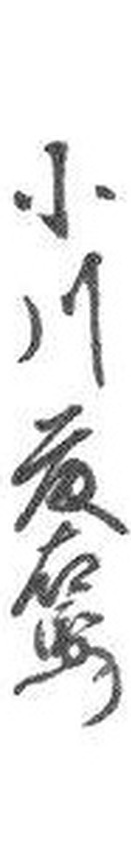小川藤右衛門
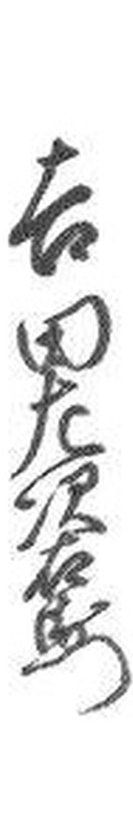吉田左次右衛門
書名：家譜 四 忠昌公 従寛永七年到正保四年
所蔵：福井県文書館 Fukui Prefectural Archives
